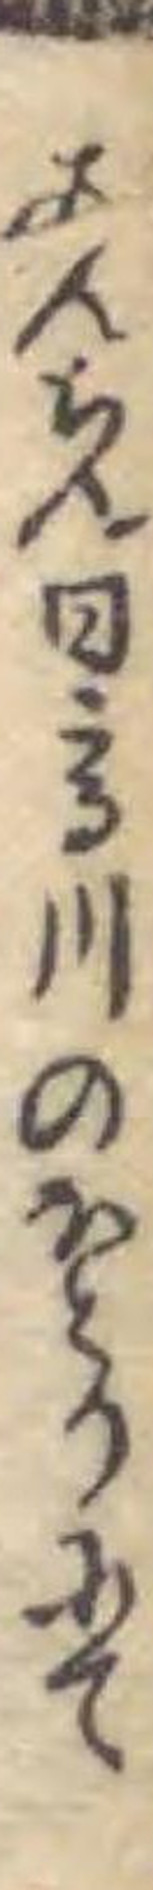あんちん日高川のほとりにて
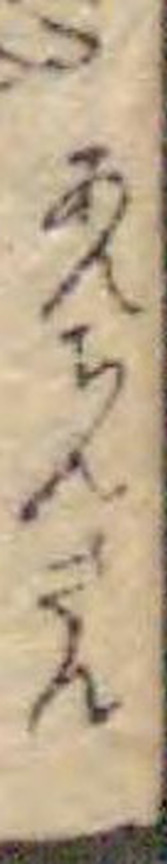あんちんさん
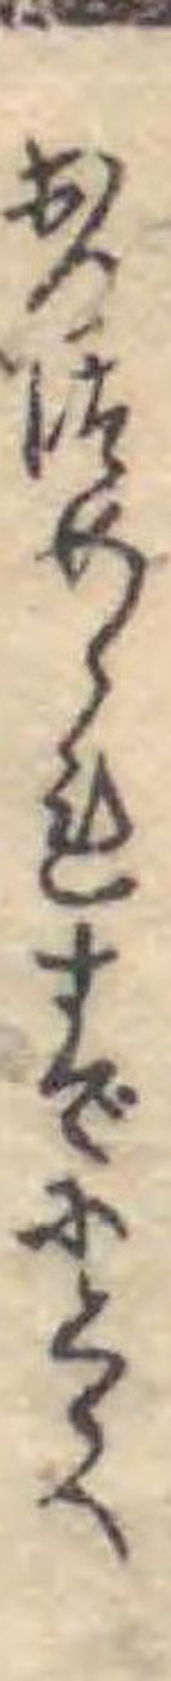おつつめられすでにとらへ
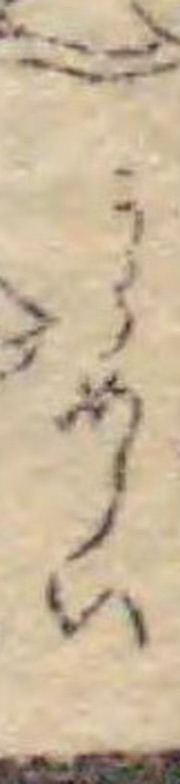うらめしい
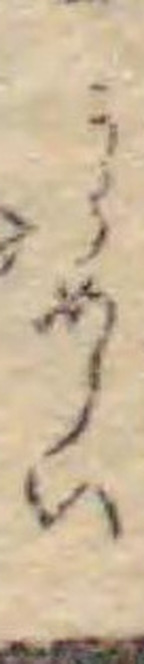うらめしい
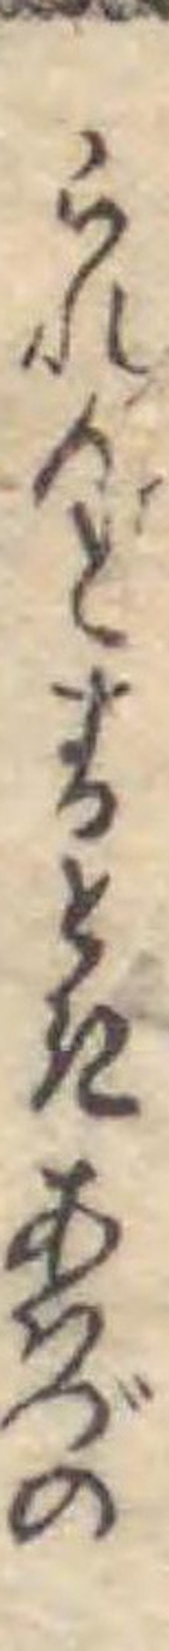られんとするときあいづの
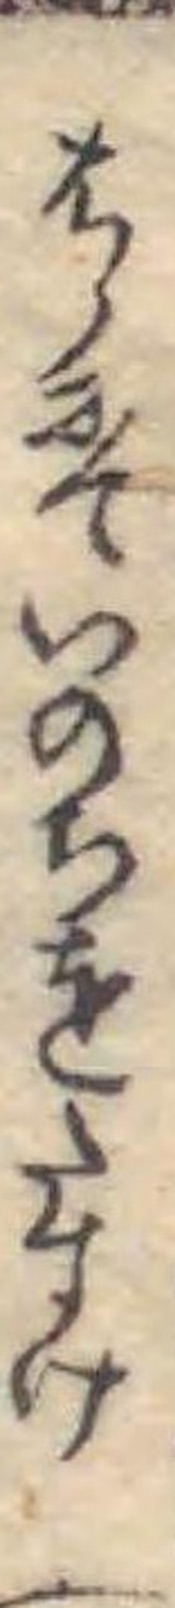はらにていのちをたすけ
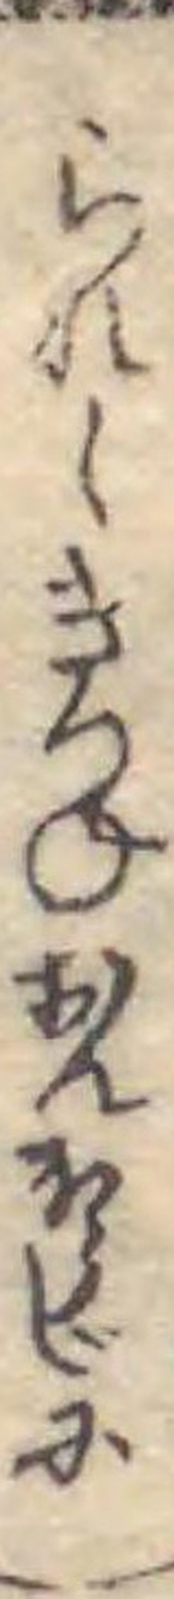られしきつねおんほうじに
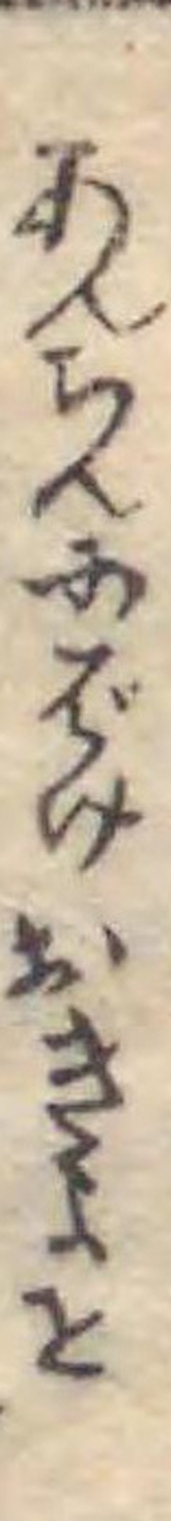あんちんにばけおきよを
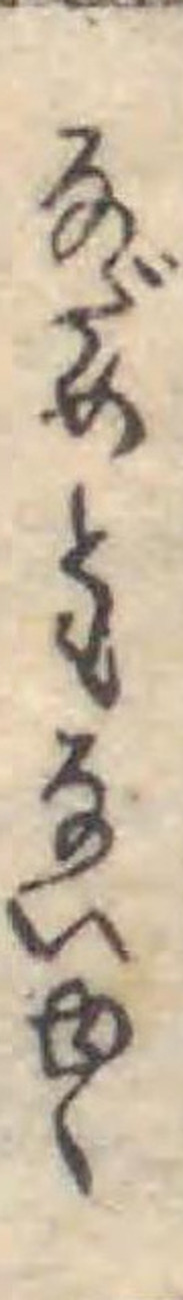なだめともないゆく
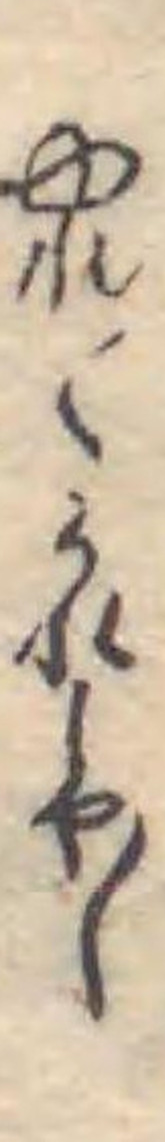やれ〳〵うれしや〳〵
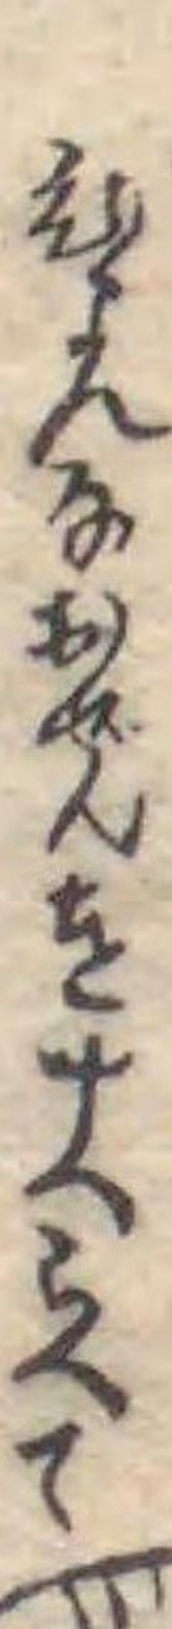ひよんなおぜんをすへらへて
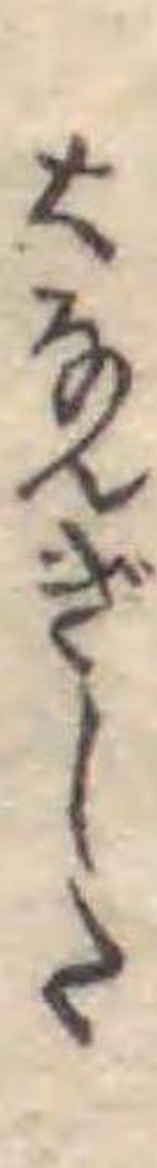大なんぎした
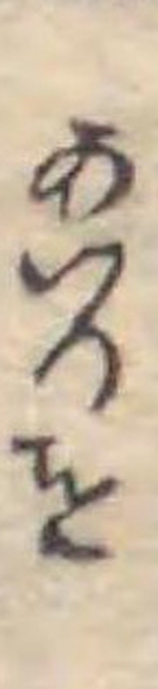あいつを
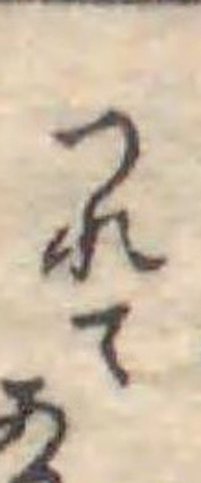つれて
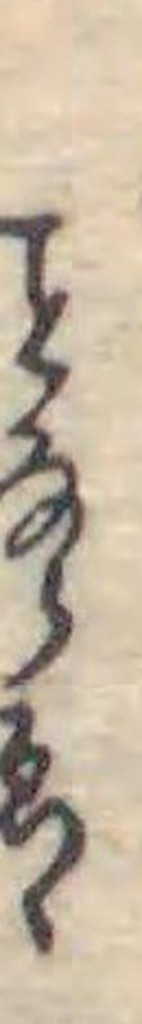ことならゑゝ
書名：鐘入七人化粧 : 3巻
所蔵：国立国会図書館 National Diet Library, JAPAN
